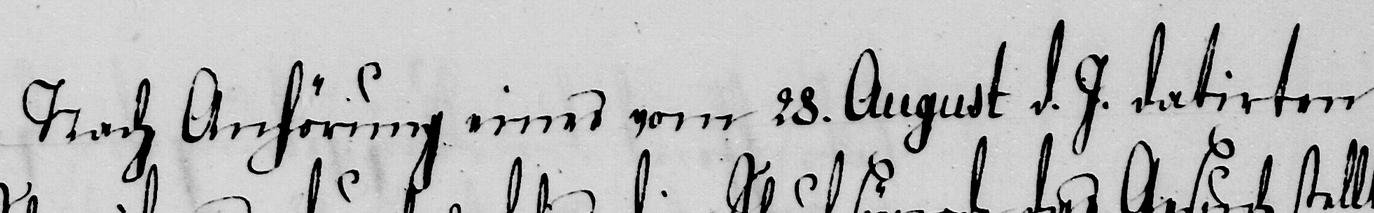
Nach Anhörung eines vom 28. August d. J. datirten
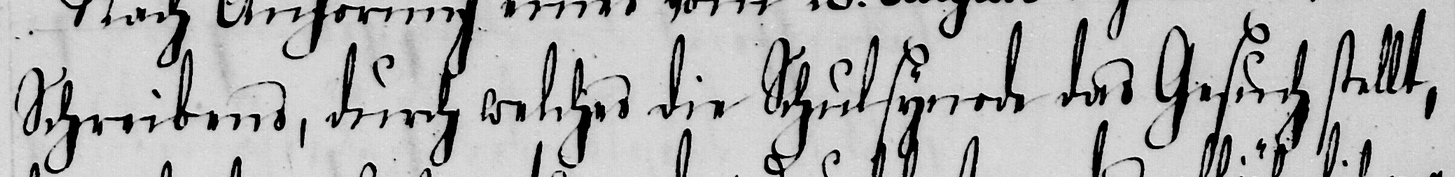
Schreibens, durch welches die Schulsynode das Gesuch stell¬
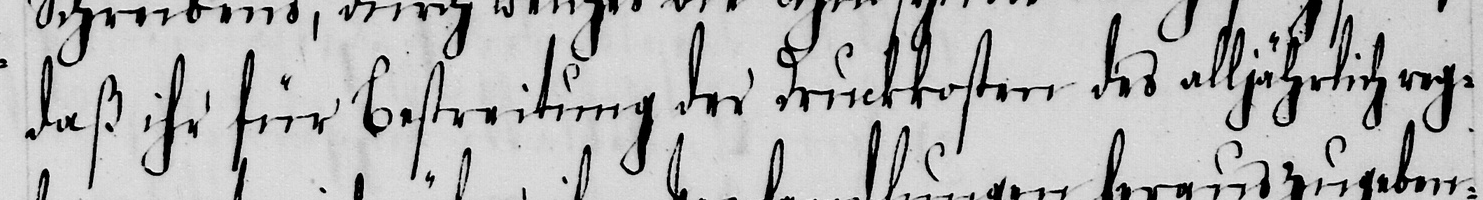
daß ihr für Bestreitung der Druckkosten des alljährlich r¬
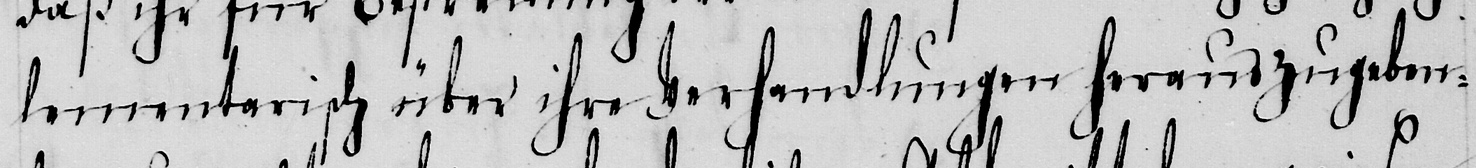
lementarisch über ihre Verhandlungen herauszugeben¬
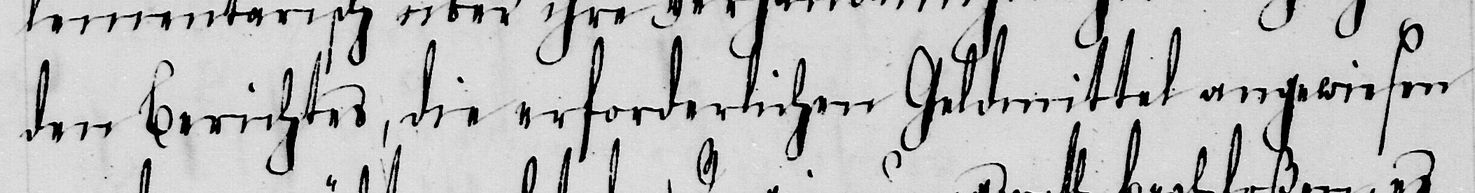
den Berichtes, die erforderlichen Geldmittel angewiesen
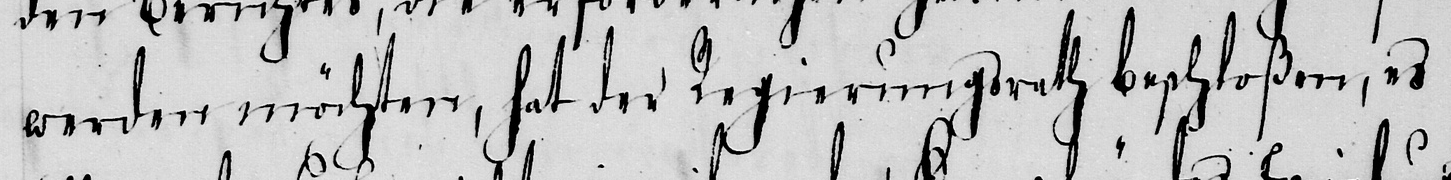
werden möchten, hat der Regierungsrath beschloßen, es
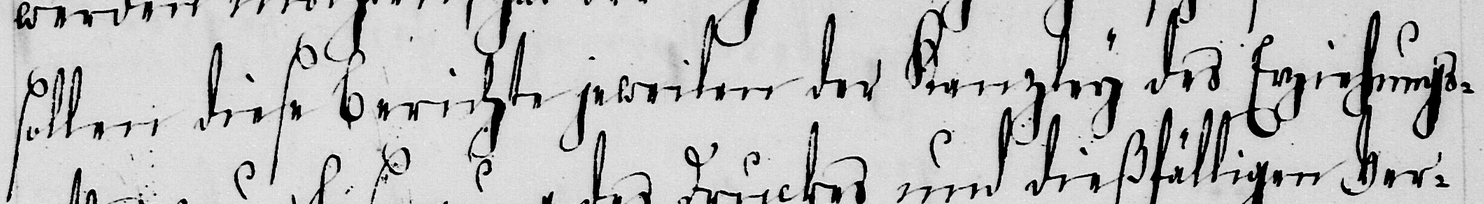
sollen diese Berichte jeweilen der Kanzley des Erziehungs¬
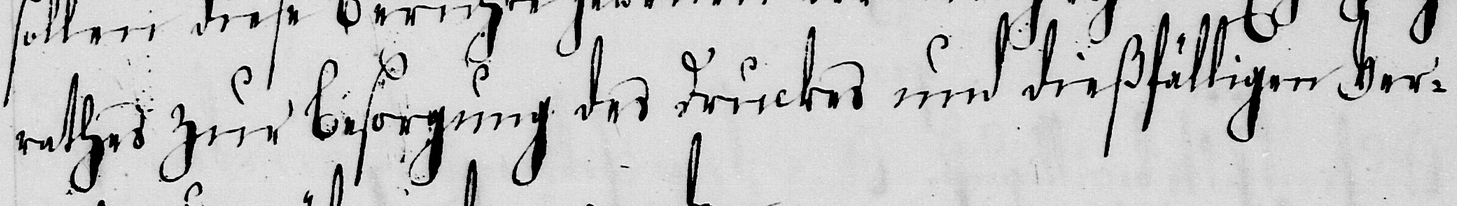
rathes zur Besorgung des Druckes und dießfälligen Ver¬
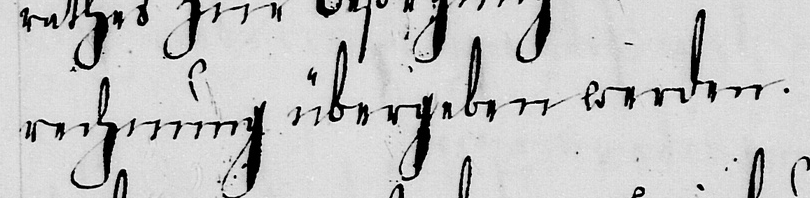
rechnung übergeben werden.
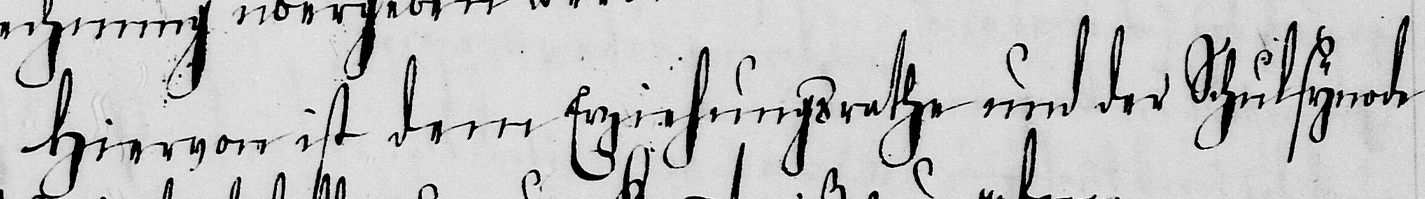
Hiervon ist dem Erziehungsrathe und der Schulsynode
